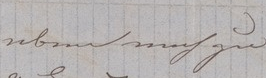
eben noch zu
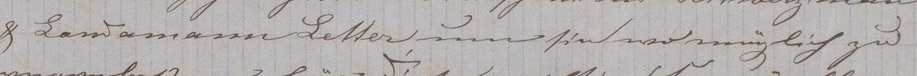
& Landammann Letter, um sie wo möglich zu
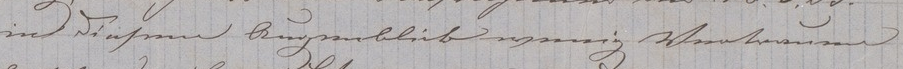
in diesem Augenblick wenig Vertrauen
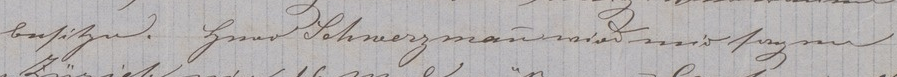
besitze. Herr Schwerzmann wird mir sagen
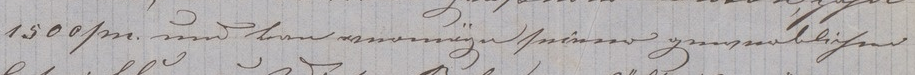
1500/m. und kan vermöge seiner gewerblichen
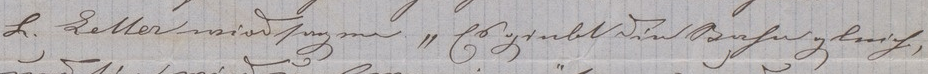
L. Letter wird sagen «Es giebt die Bahn gleich,
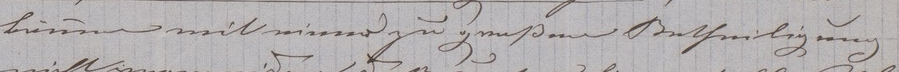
können mit einer zu großen Betheiligung
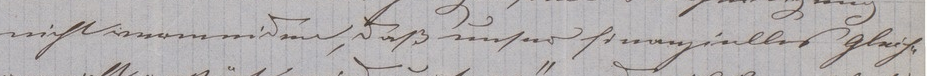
nicht vermeiden, daß unser finanzielles Gleich-
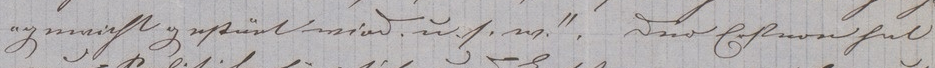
gewicht zestört wird. u. s. w.». Der Erstere hat
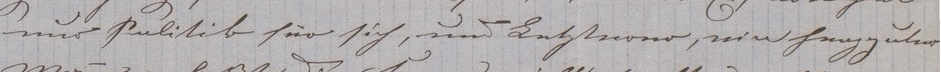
nur Politik für sich, und Letzterer, ein herzguter
